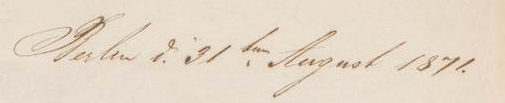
Berlin d. 31ten August 1871.
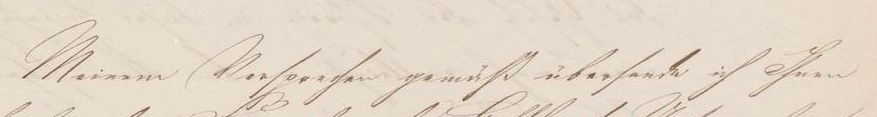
Meinem Versprechen gemäß übersende ich Ihnen
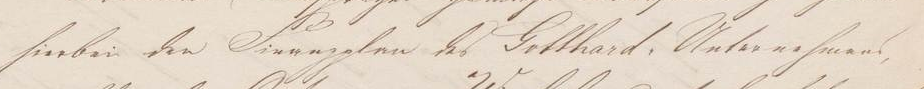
hierbei den Finanzplan des Gotthard-Unternehmens,
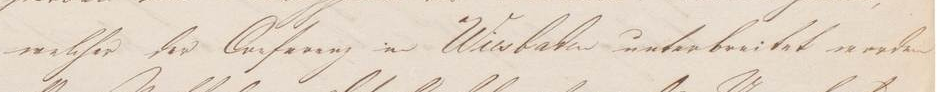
welcher der Conferenz in Wiesbaden unterbreitet worden
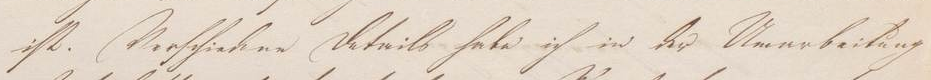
ist. Verschiedene Details habe ich in der Umarbeitung
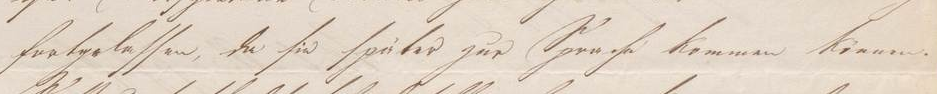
fortgelassen, da sie später zur Sprache kommen können.
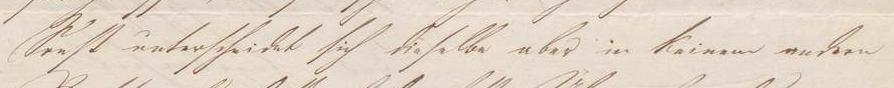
Sonst unterscheidet sich dieselbe aber in keinem andern
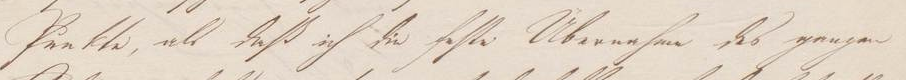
Punkte, als daß ich die feste Übernahme des ganzen
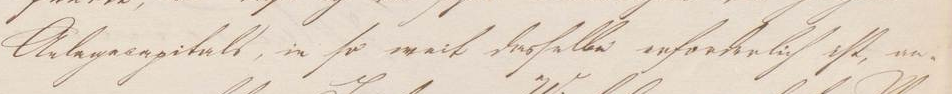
Anlagecapitals, in so weit dasselbe erforderlich ist, an-
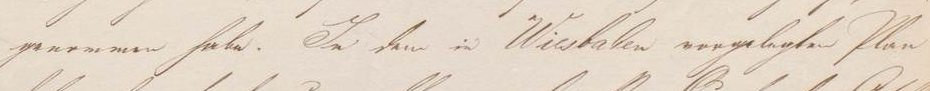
genommen habe. In dem in Wiesbaden vorgelegten Plan
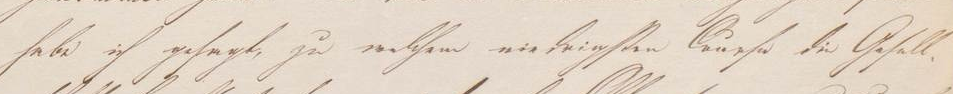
habe ich gesagt, zu welchem niedrigsten Course die Gesell-
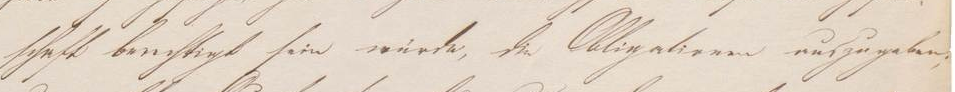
schaft berechtigt sein würde, die Obligationen auszugeben;
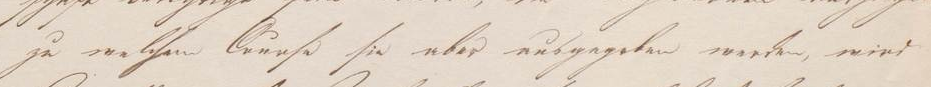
zu welchen Course sie aber ausgegeben werden, wird
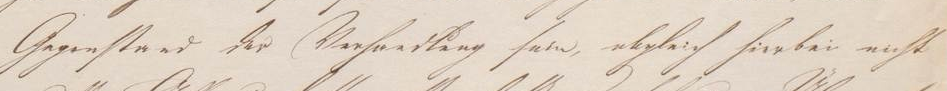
Gegenstand der Verhandlung sein, obgleich hierbei nicht
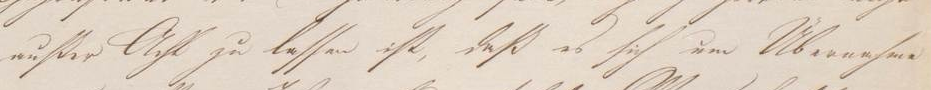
außer Acht zu lassen ist, daß es sich um Übernahme
